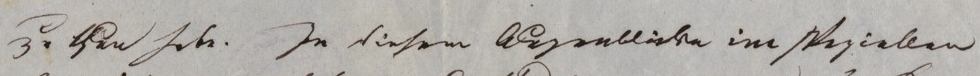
zu thun habe. In diesem Augenblicke im speziellen
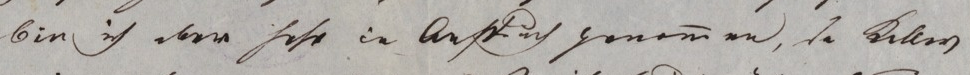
bin ich aber sehr in Anspruch genommen, da Keller
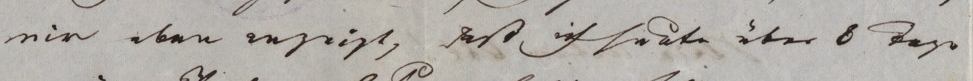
mir eben anzeigt, daß ich heute über 8 Tage
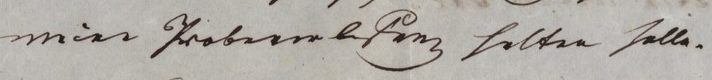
meine Probevorlesung halten solle.
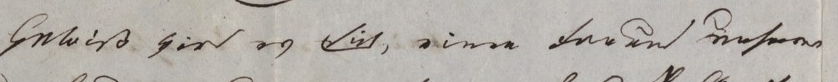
Gewiß wird es Dich, einen Freund unserer
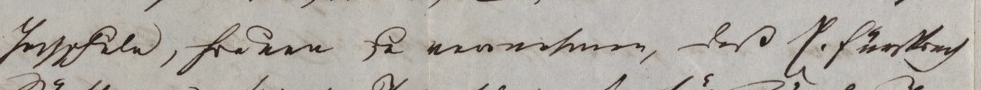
Hochschule, freuen zu vernehmen, daß H. Fürsprech
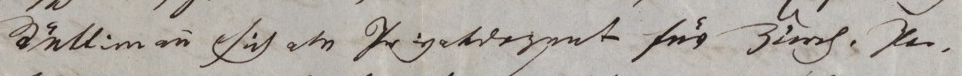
Rüttimann sich als Privatdozent für Zürch. Par-
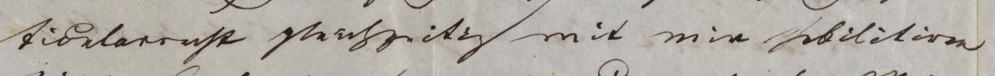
ticularrecht gleichzeitig mit mir habilitiren
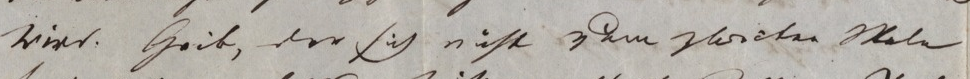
wird. Geib, der sich nicht zum zweiten Male
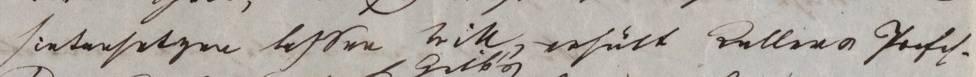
hintansetzen lassen will, erhält Kellers Profes-
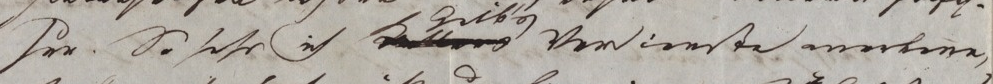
sur. So sehr ich KellersGeib's Verdienste anerkenne,
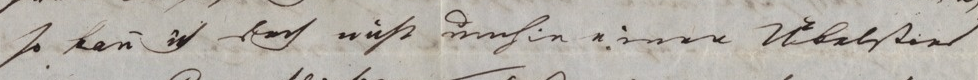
so kann ich doch nicht umhin einen Übelstand
